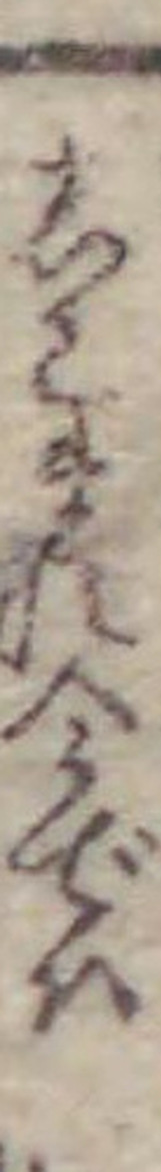しこまれ今では
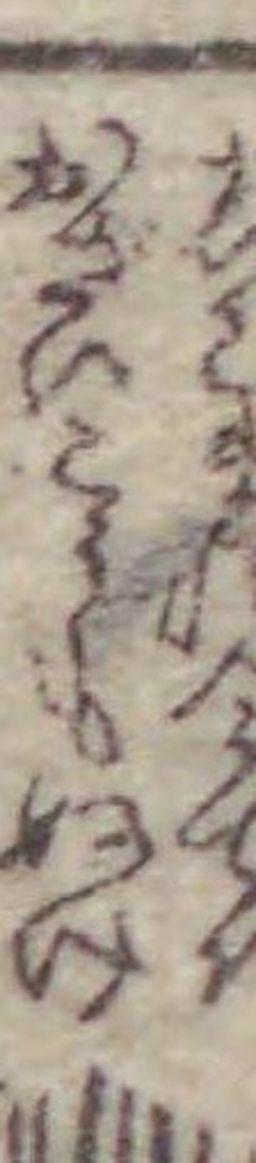おざいこうもぬけ
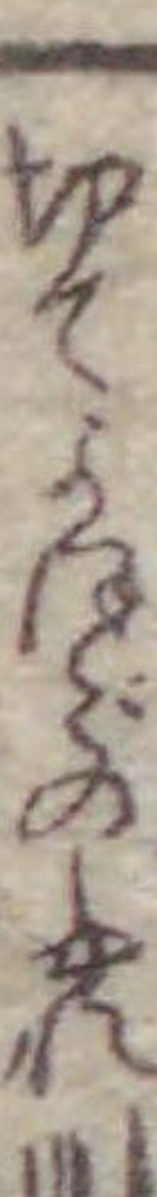切てよほどのしやれ
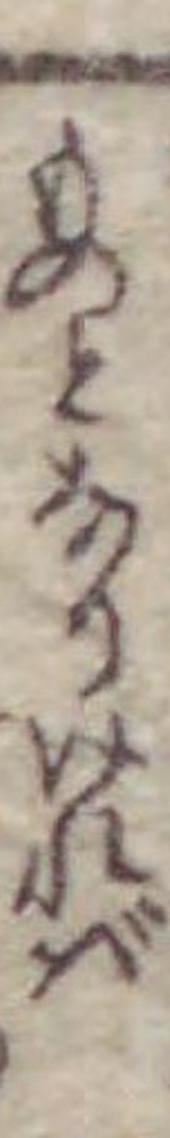ものとなりければ
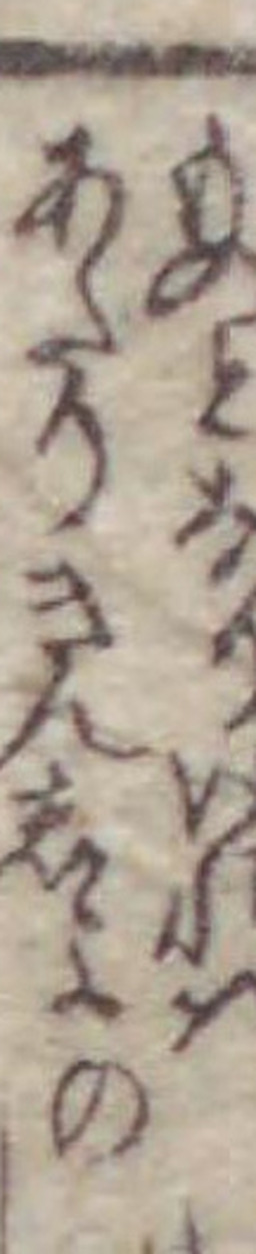あたりきんしよの
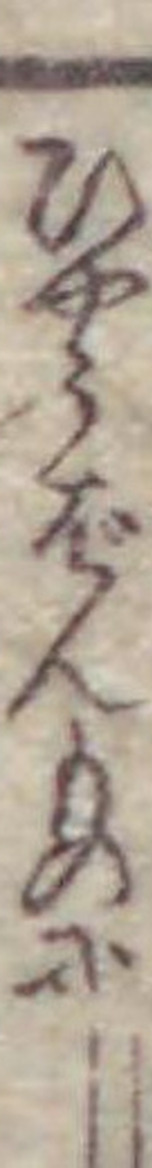ひやうばんものに
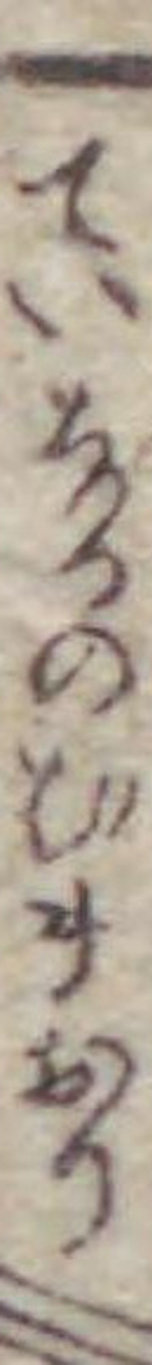ていなかのひまおり
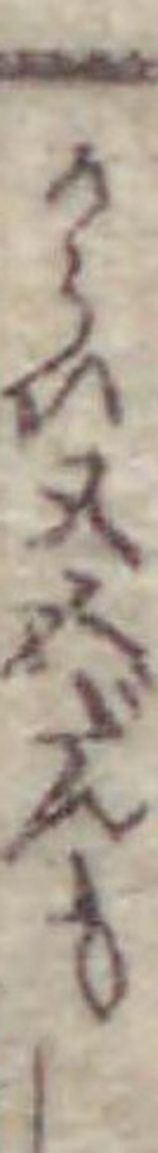からは又五だんも
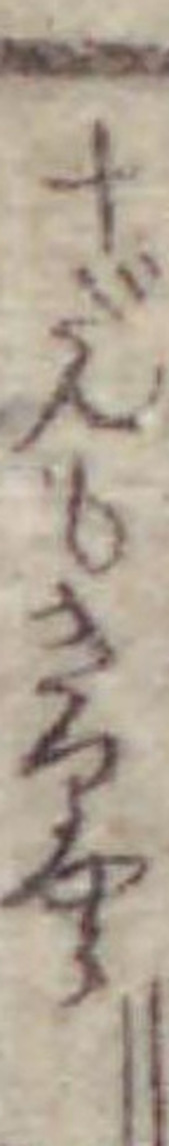十だんもきりやう
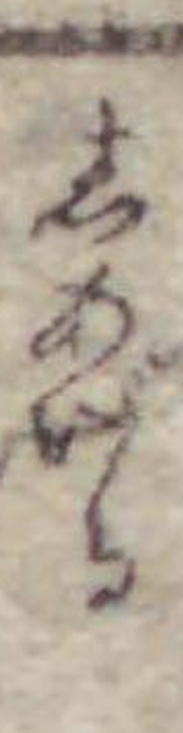をあげる
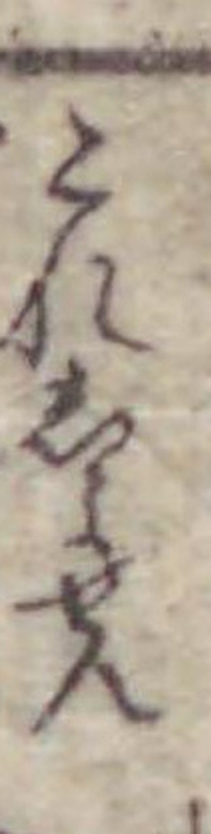これしよせん
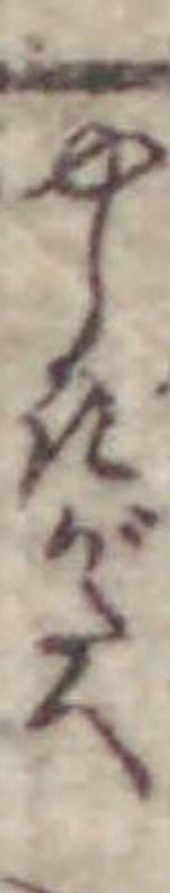やしきがたへ
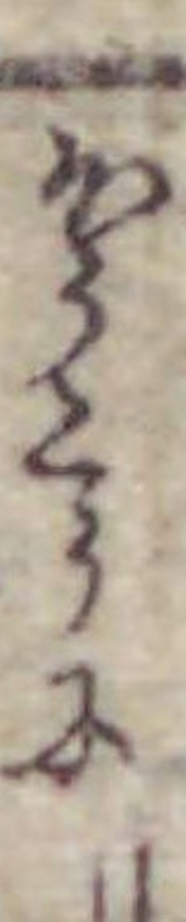ほうこうに
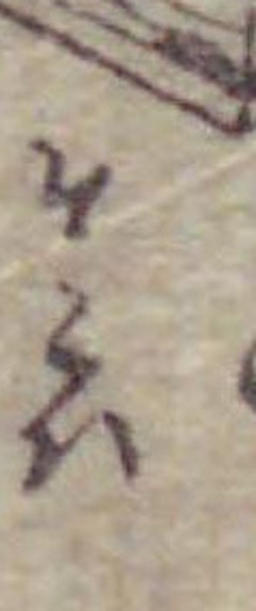そこは
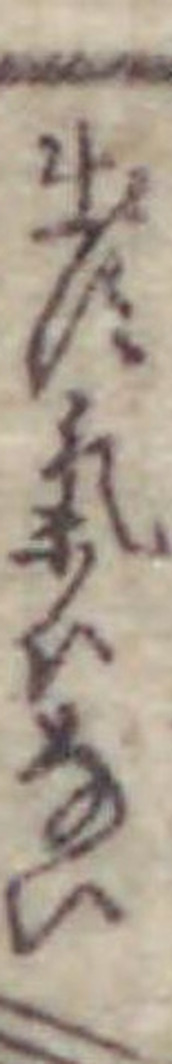出す気はない
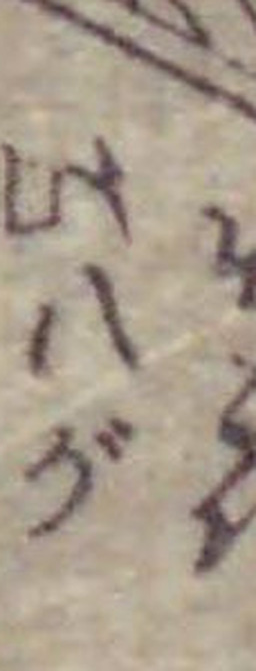此八が
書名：嗚呼不侭世之助噺 : 3巻
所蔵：国立国会図書館 National Diet Library, JAPAN
